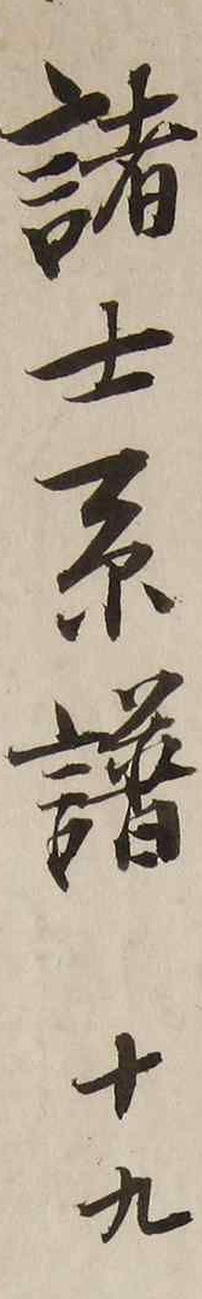諸士系譜十九

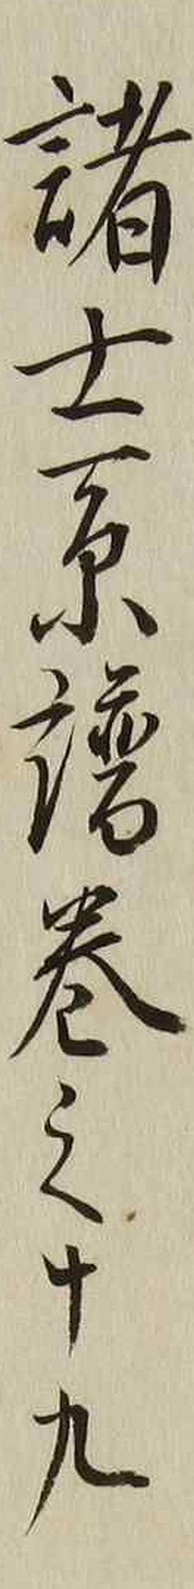諸士系譜巻之十九
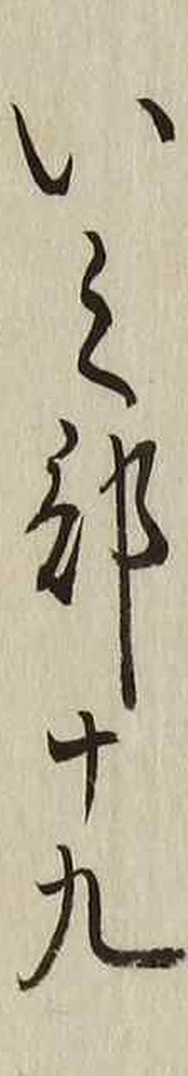い之部十九
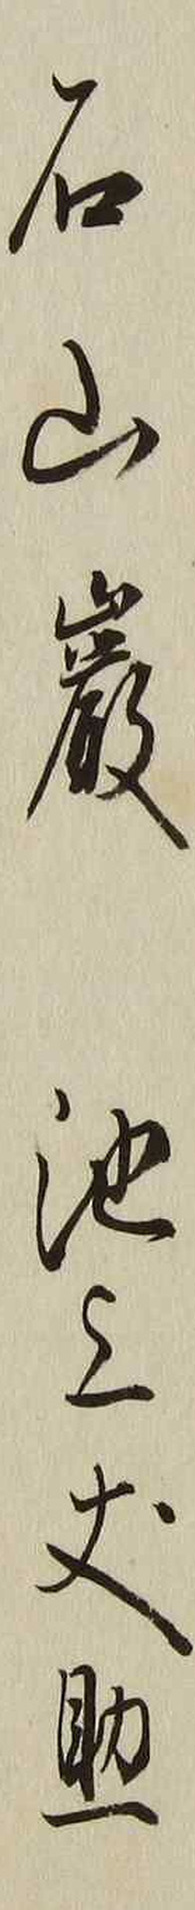石山巌池上丈助
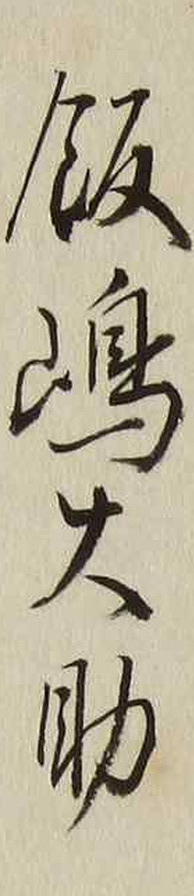飯嶋大助

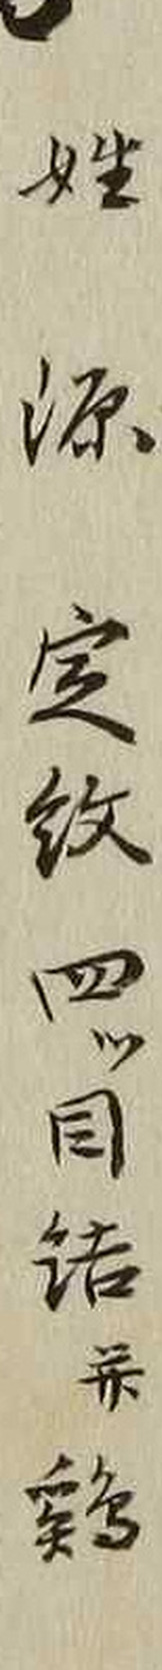姓源定紋四ツ目詰幷鶏
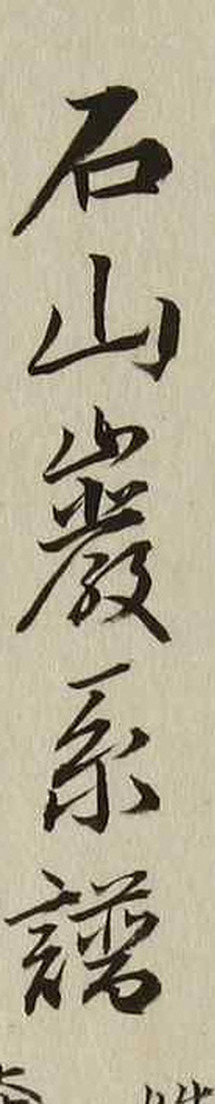石山巌系譜
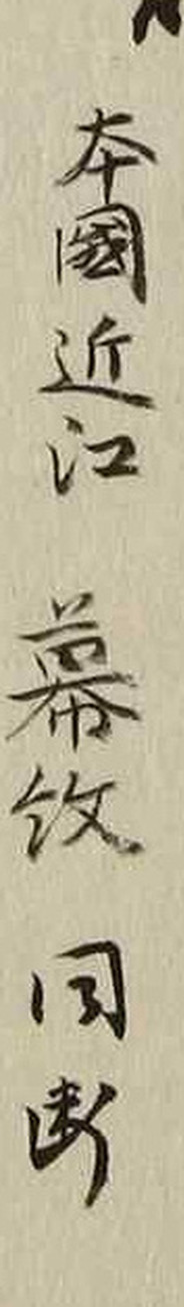本圀近江幕紋同断
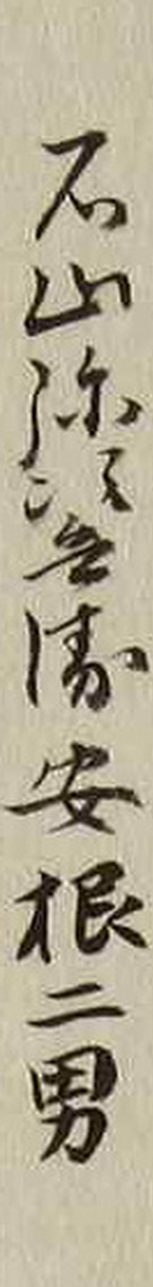石山弥次兵衛安根二男
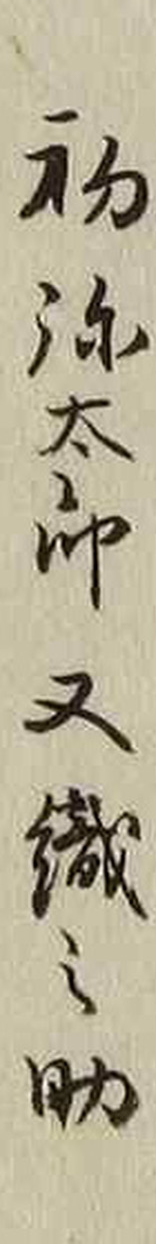初弥太郎又織之助
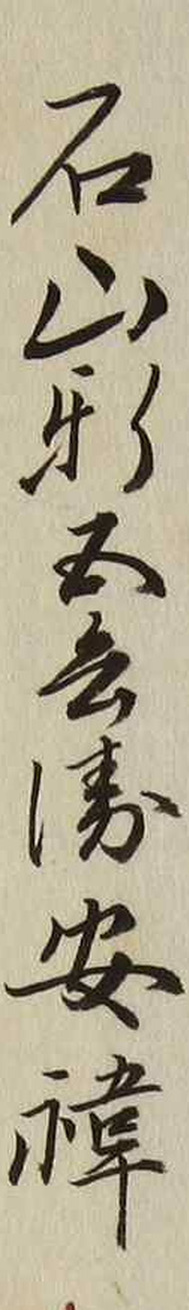石山新五兵衛安禕
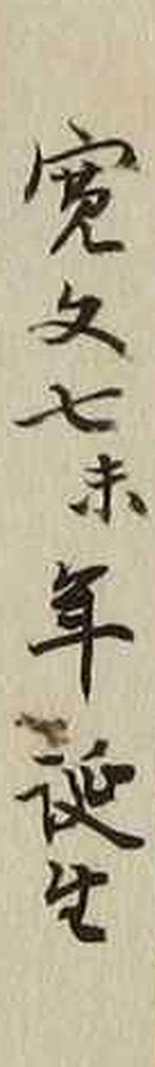寛文七未年誕生
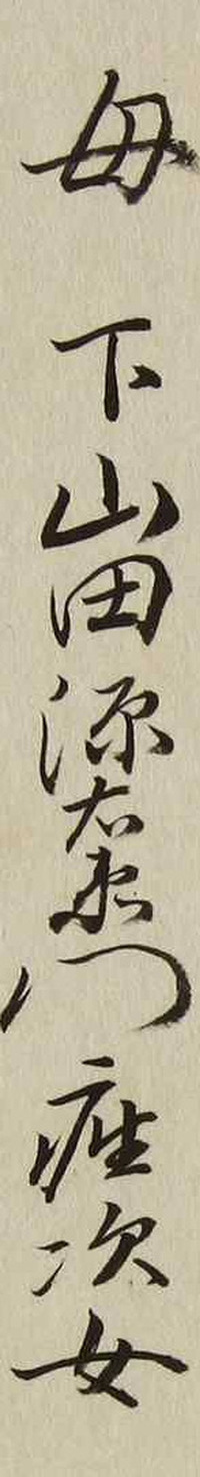母下山田源右衛門座次女
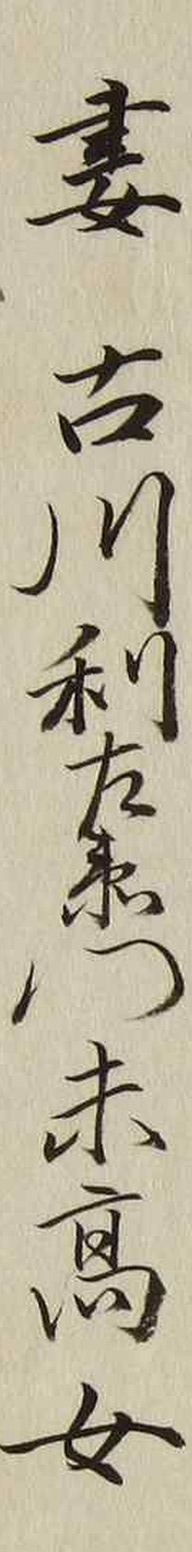妻古川利左衛門未高女
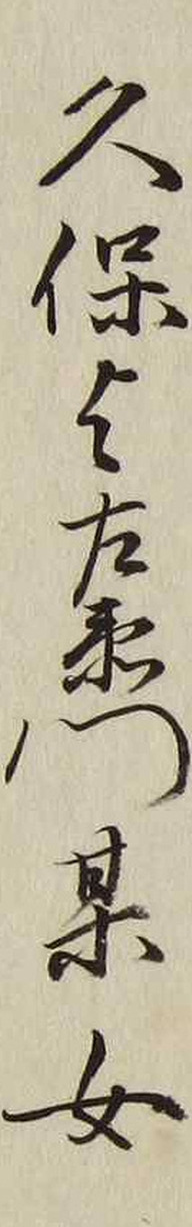久保與左衛門某女

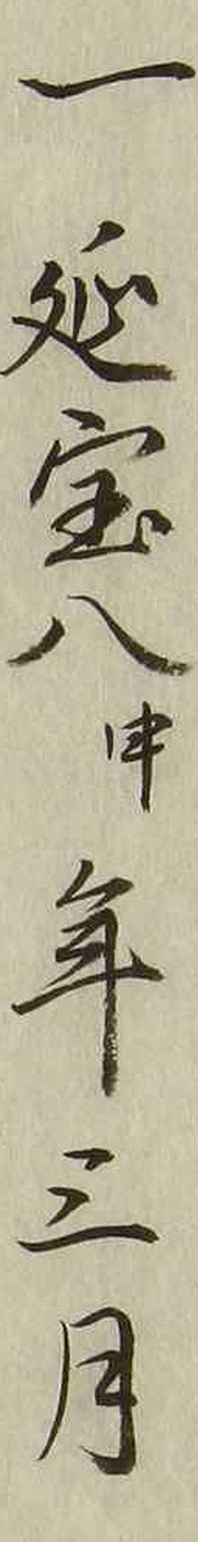一延宝八申年三月
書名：諸士系譜　巻之19　い之部19
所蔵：会津若松市立会津図書館
